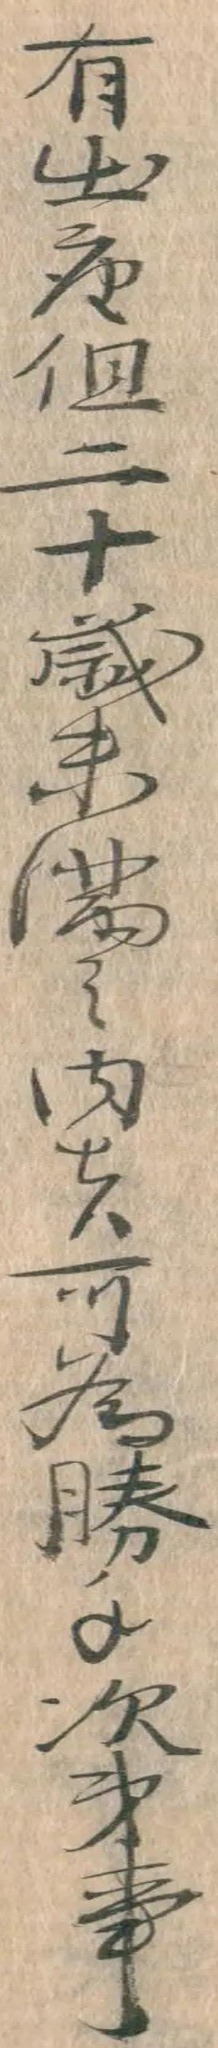有出座但二十歳未満之内者可為勝手次第事
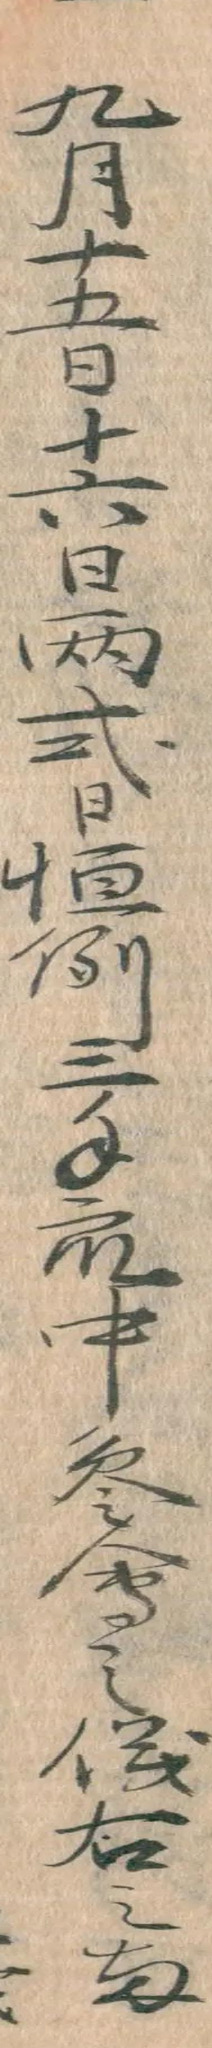一九月十五日十六日両式日恒例三手衆中参會之儀右之両
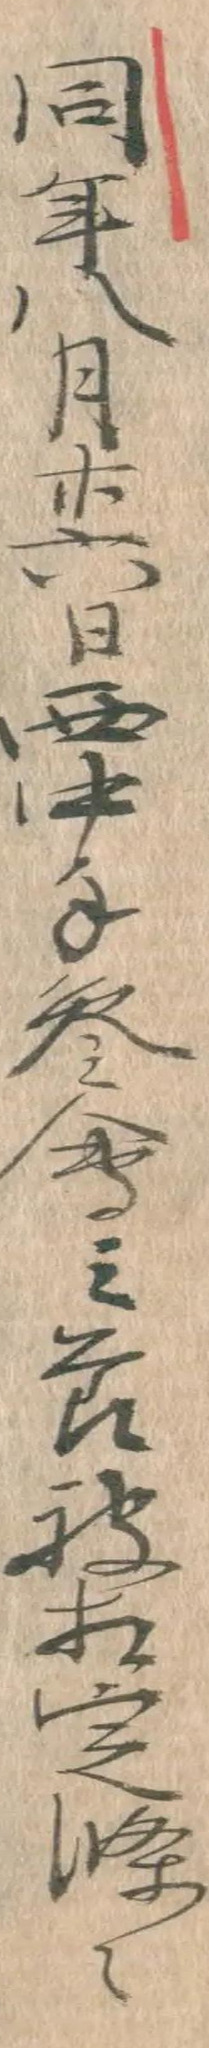同年八月廿六日西中手参會之節被相定條々
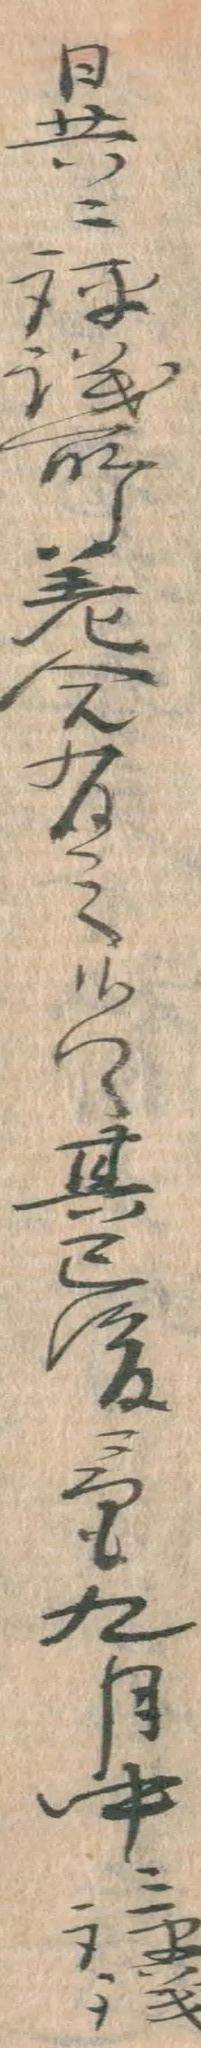日共に評議所差合有之候ハヽ其已後ニ而も九月中に評儀
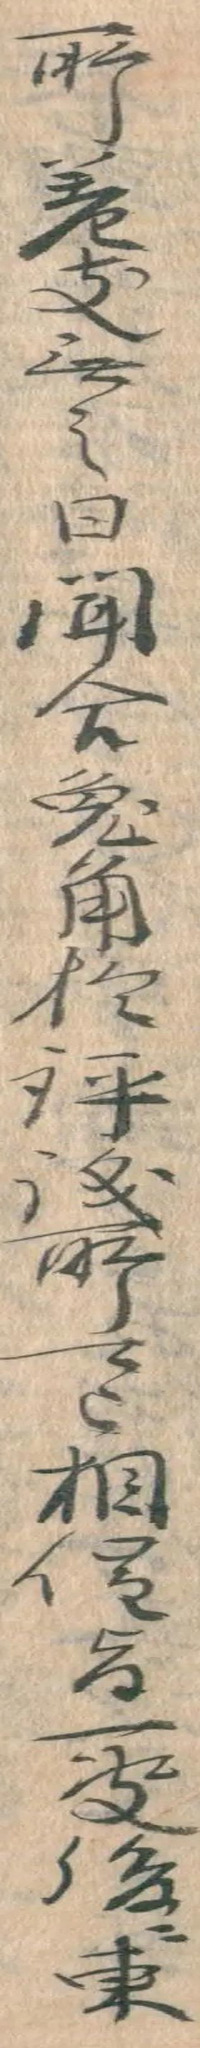所差支無之日聞合兎角於評議所可被相催旨一決後ニ東
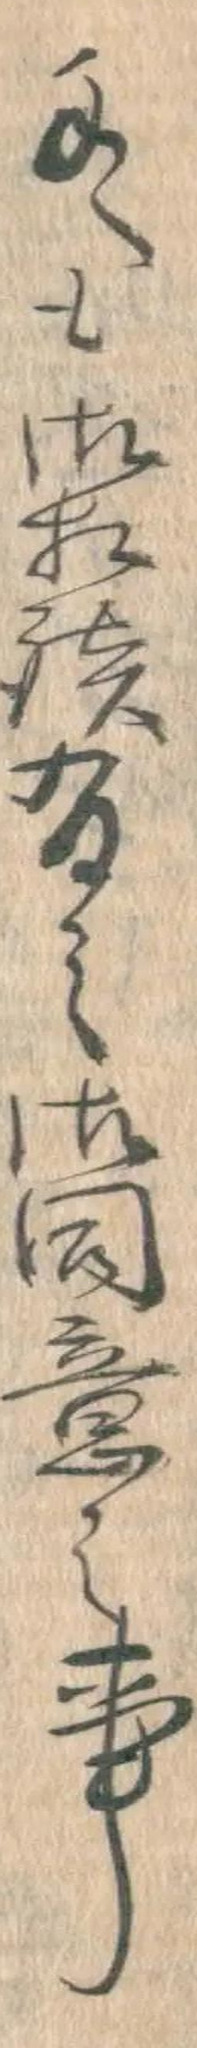手へも御相談有之御同意之事
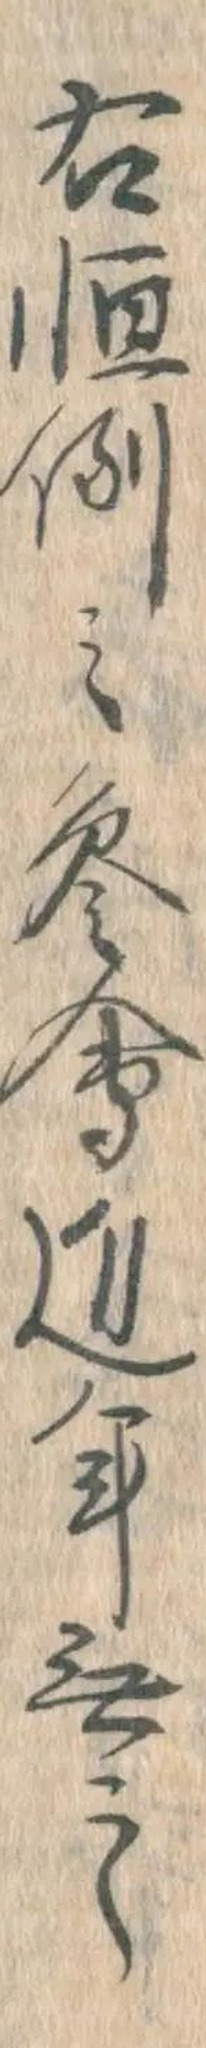右恒例之参會近年無之
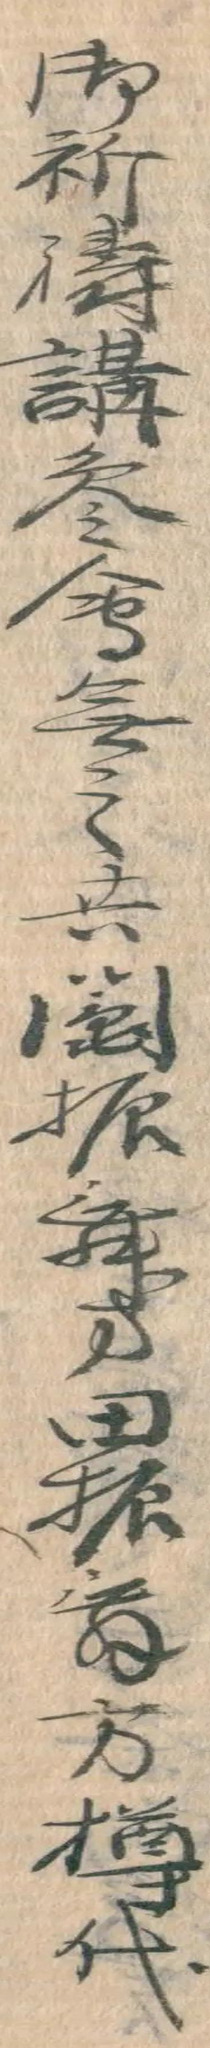一御祈祷講参會無之共鬮振舞方田振舞万樽代
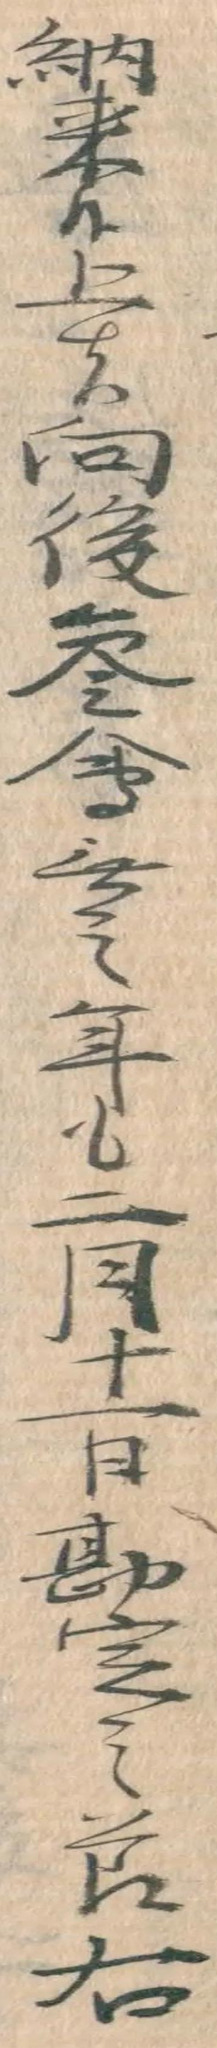納来候上は向後参會無之年も二月十一日勘定之節右

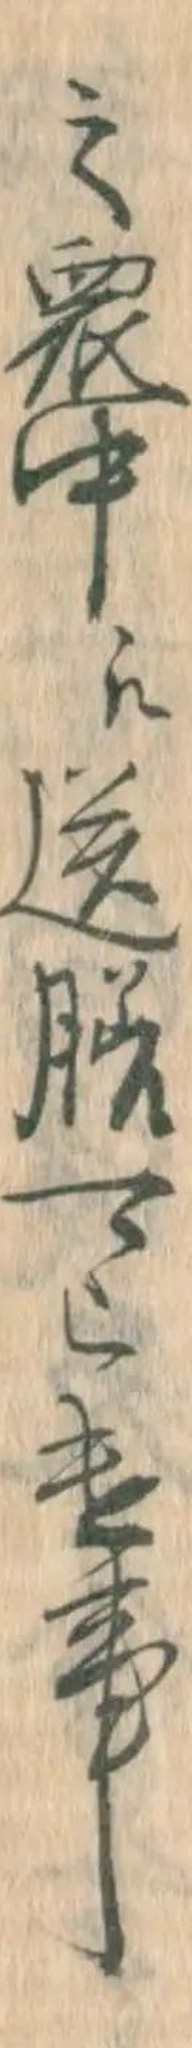之衆中え送膳可被遣事
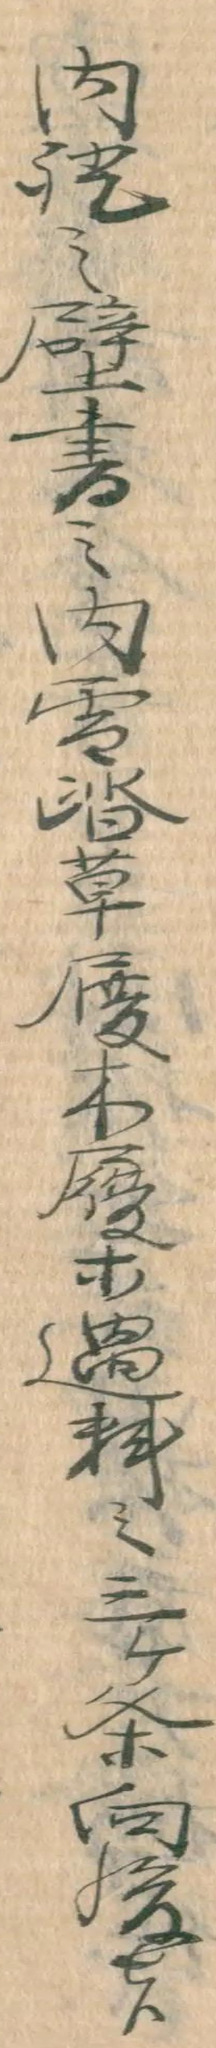一内證之壁書之内雪踏草履木履等過料之三ケ条向後は
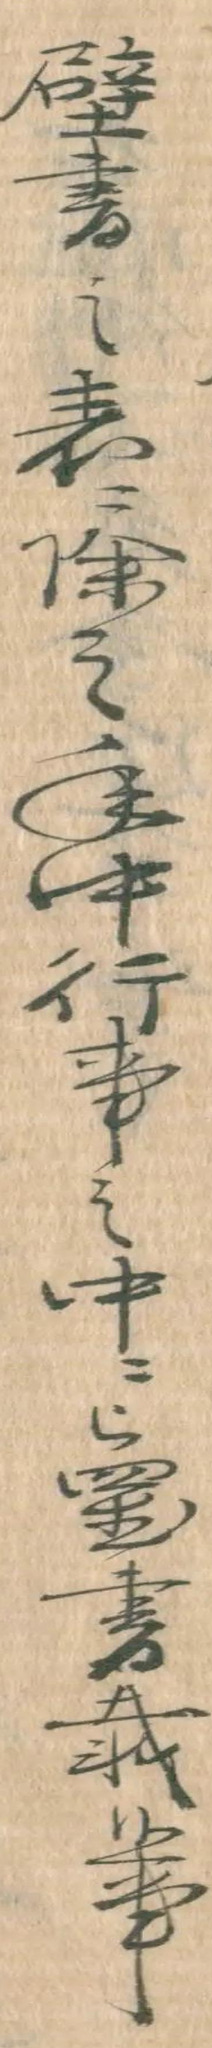壁書之表ニ除之年中行事之中ニ被置書載候事
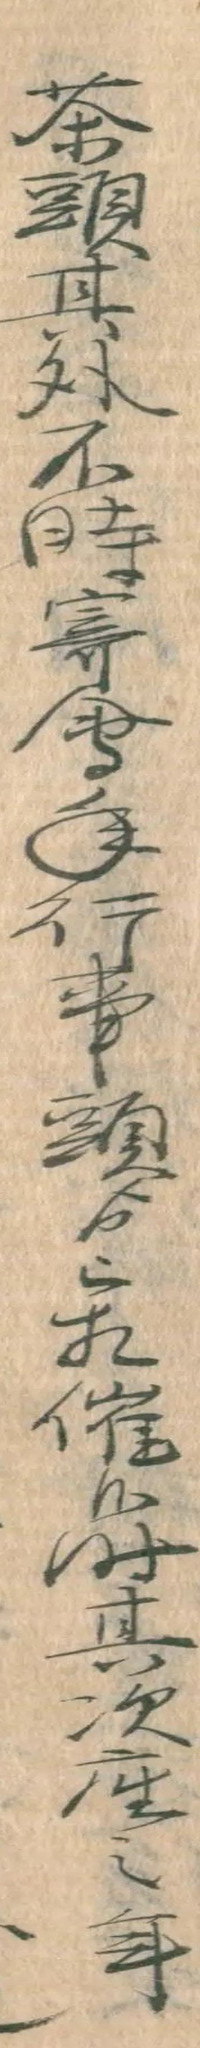一茶頭其外不時寄會年行事頭ゟ被相催候時其次座之年
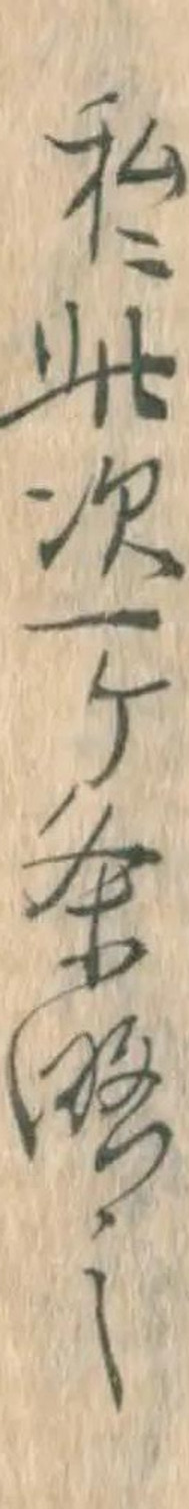私ニ此次一ヶ条略之
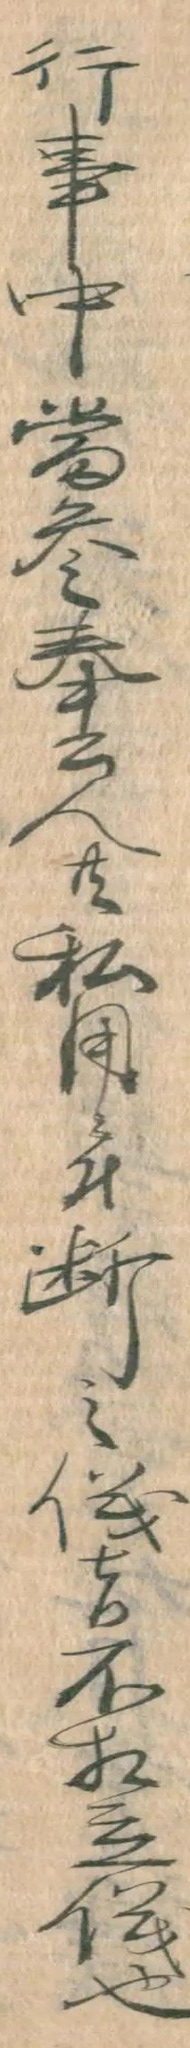行事中當参奉公人共私用ニ付断之儀旨不相立儀也
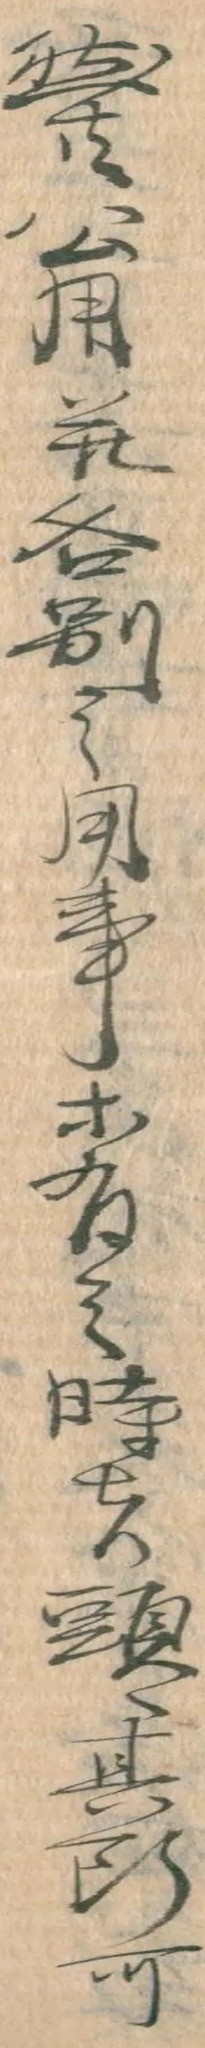然共公用幷各別之用事等有之時者頭へ其断可
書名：賀茂社記録. 第29冊
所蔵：国立国会図書館 National Diet Library, JAPAN
